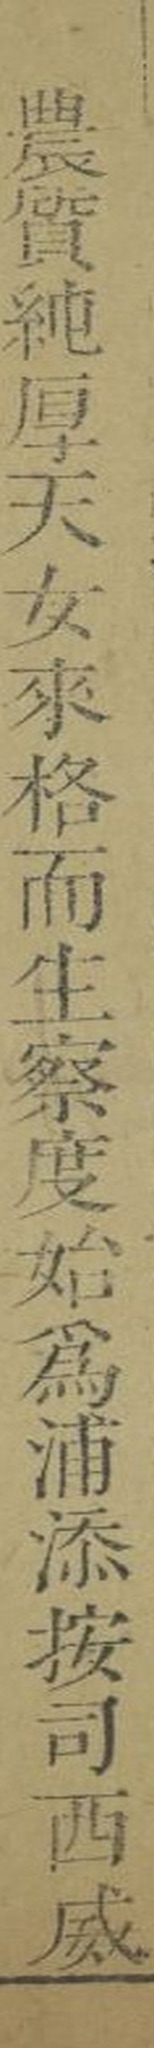農質純厚天女来格而生察度始為浦添按司西威
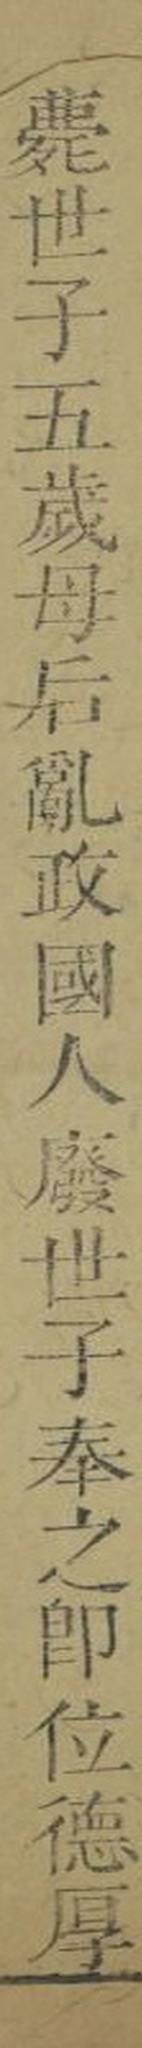薨世子五歳母后乱政国人廃世子奉之即位徳厚
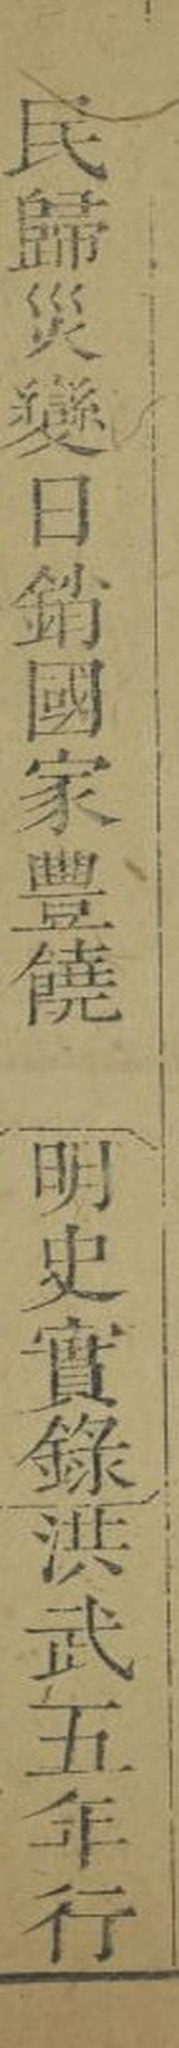民帰災変日銷国家豊饒[明史実録]洪武五年行
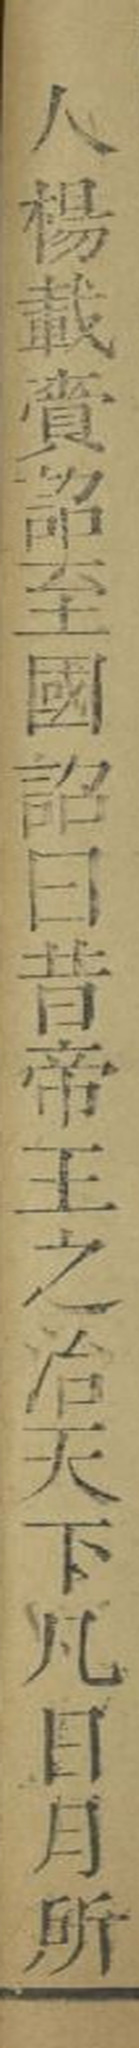人楊載賚詔至国詔曰昔帝王之治天下凡日月所
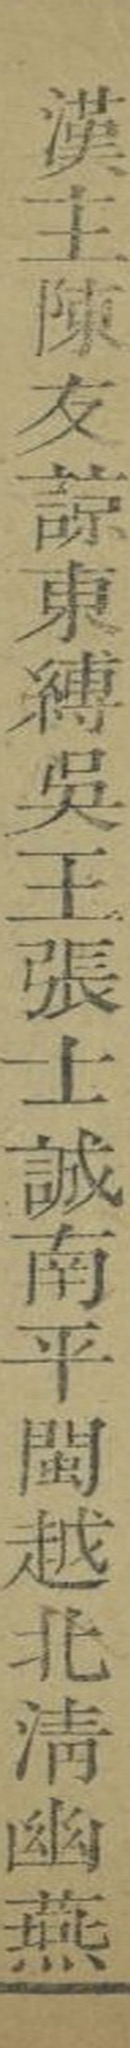漢主陳友諒東縛呉王張士誠南平閩越北清幽燕
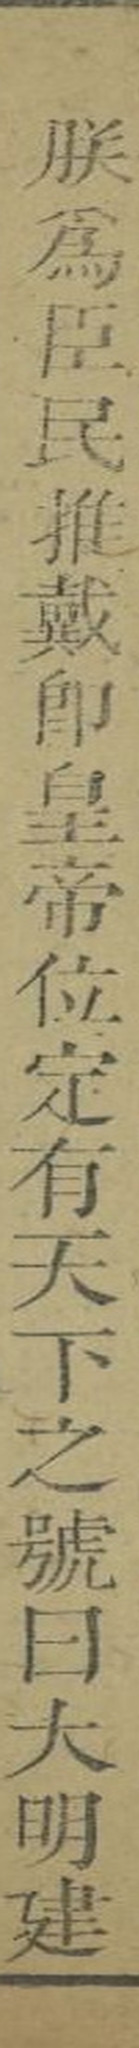朕為臣民推戴即皇帝位定有天下之号曰大明建
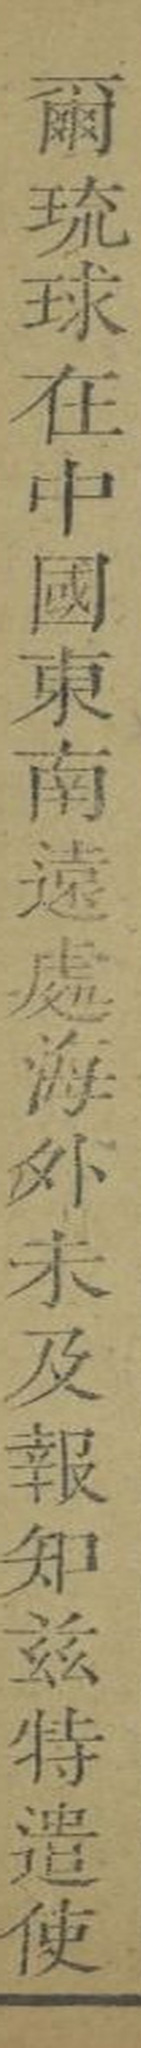爾琉球在中国東南遠処海外未及報知茲特遣使

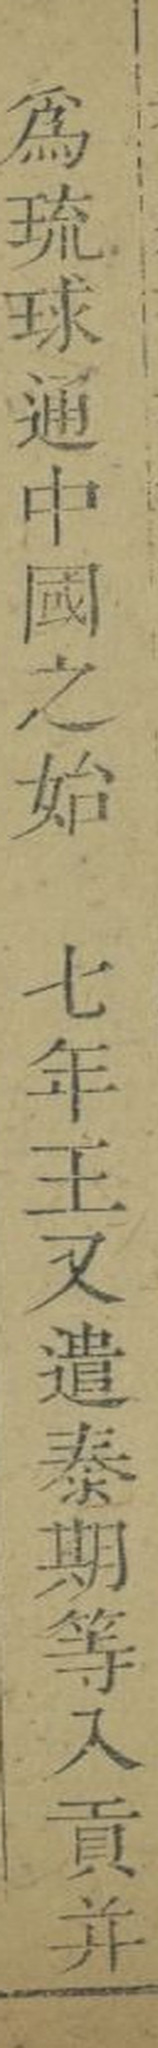為琉球通中国之始七年王又遣泰期等入貢并
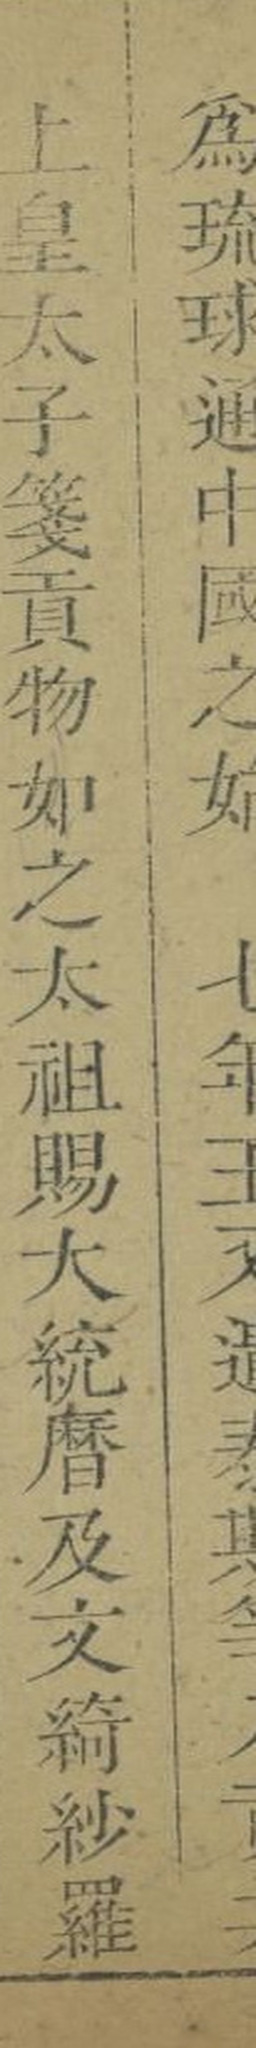上皇太子箋貢物如之太祖賜大統暦及文綺紗羅
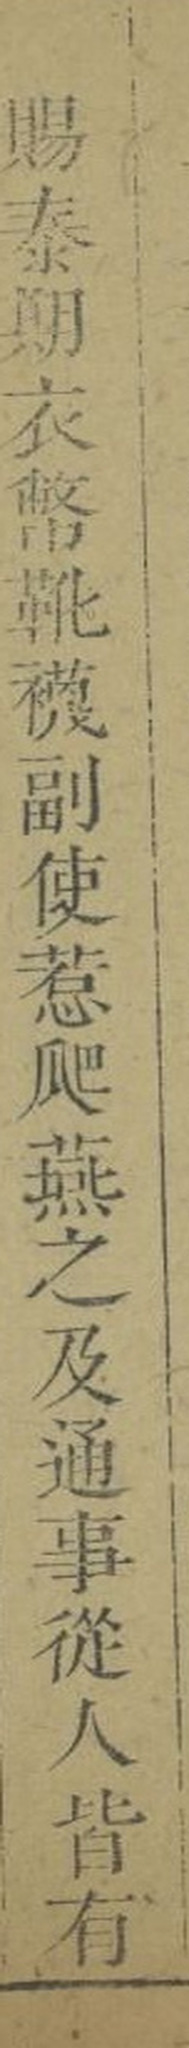賜泰期衣幣靴襪副使惹爬燕之及通事従人皆有
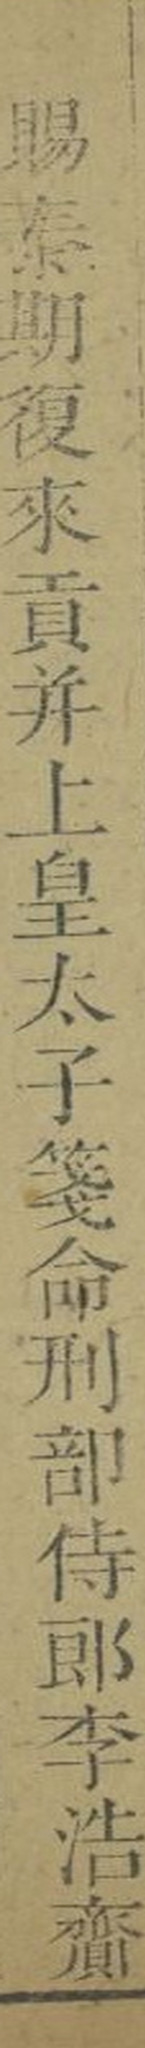賜泰期復来貢并上皇太子箋命刑部侍郎李浩齎
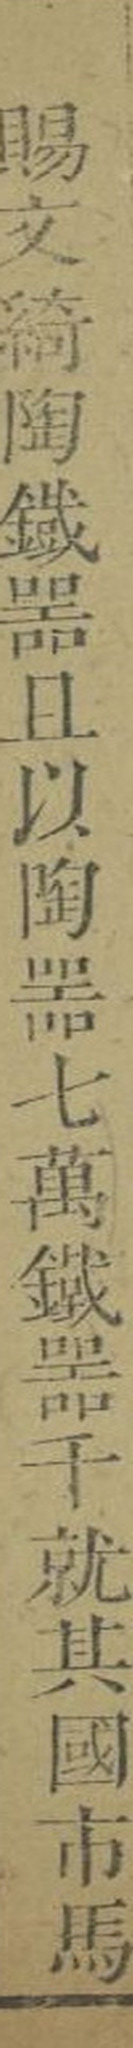賜文綺陶鉄器且以陶器七万鉄器千就其国市馬
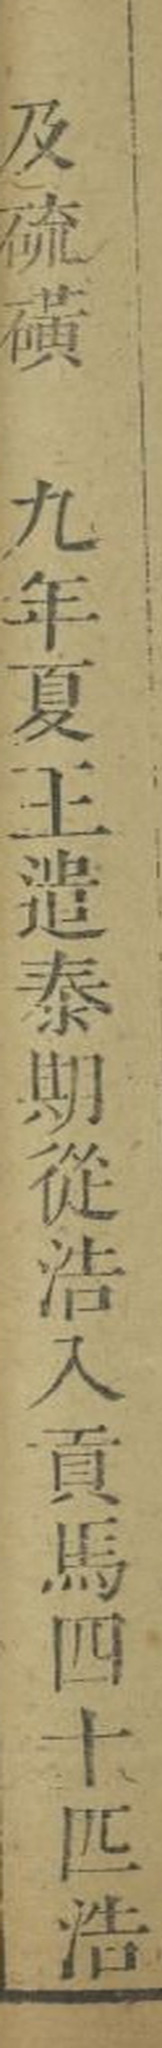及硫磺九年夏王遣泰期従浩入貢馬四十匹浩
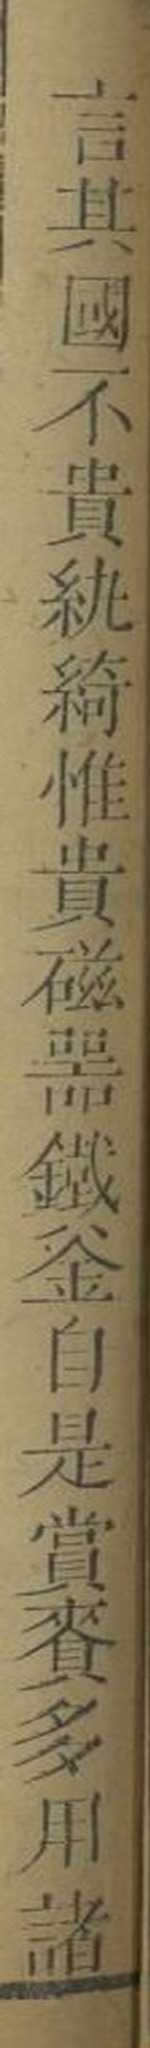言其国不貴紈綺惟貴磁器鉄釜自是賞賚多用諸
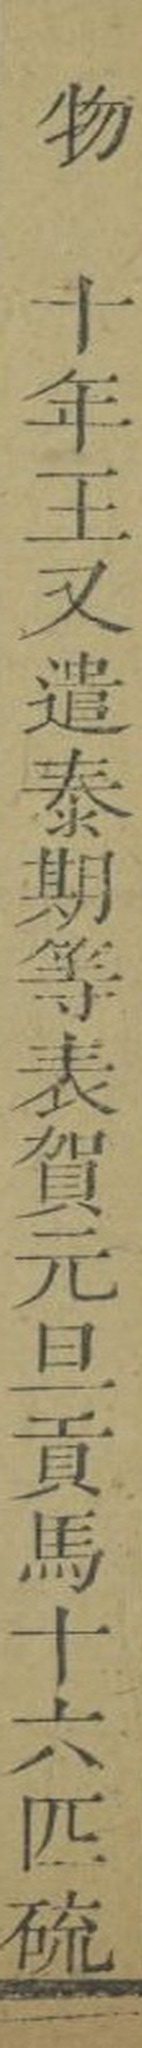物十年王又遣泰期等表賀元旦貢馬十六匹硫
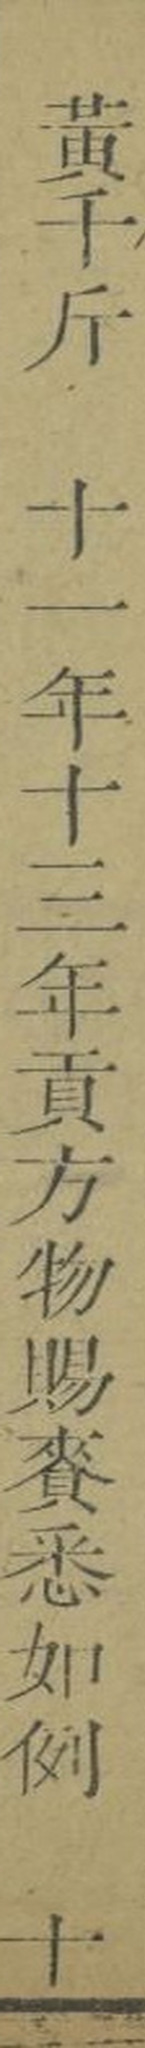黄千斤十一年十三年貢方物賜賚悉如例十
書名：中山伝信録 巻三
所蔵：University of the Ryukyus Library
